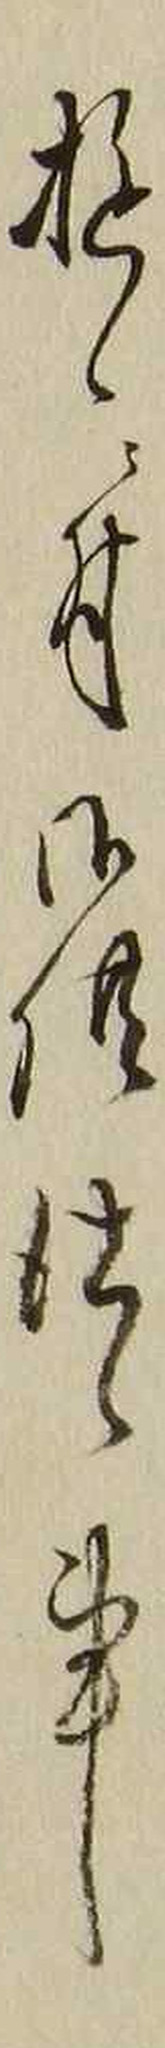遊候ニ付御供仕候事
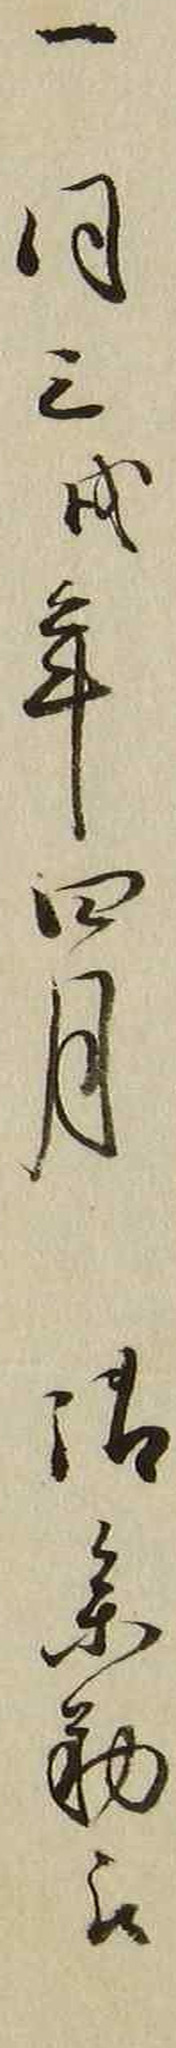一同三戌年四月御参勤被
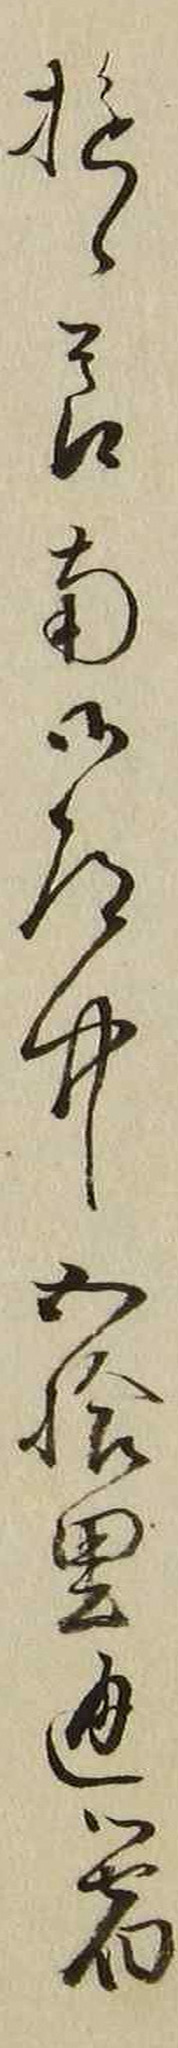遊候節南御道中五拾里通御宿
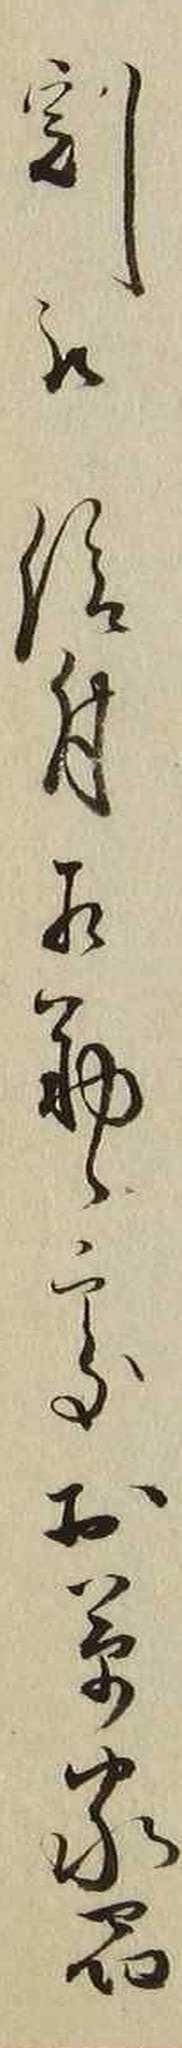割被仰付相勤候処於草家宿
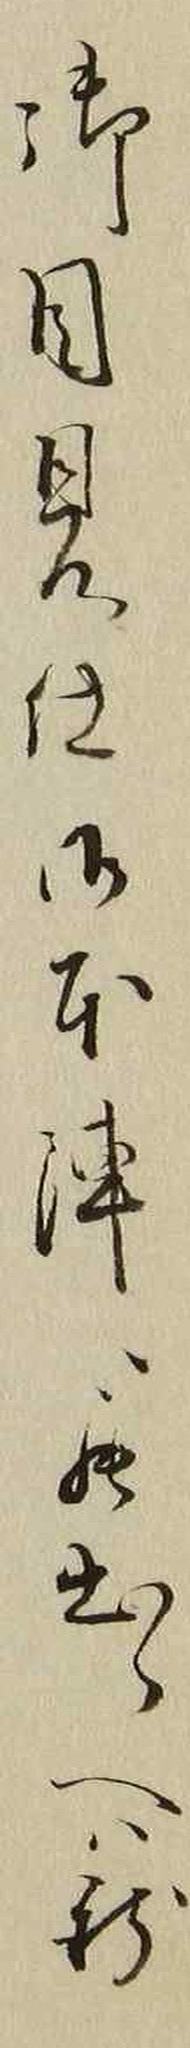御目見仕御本陣へ罷出候へハ新
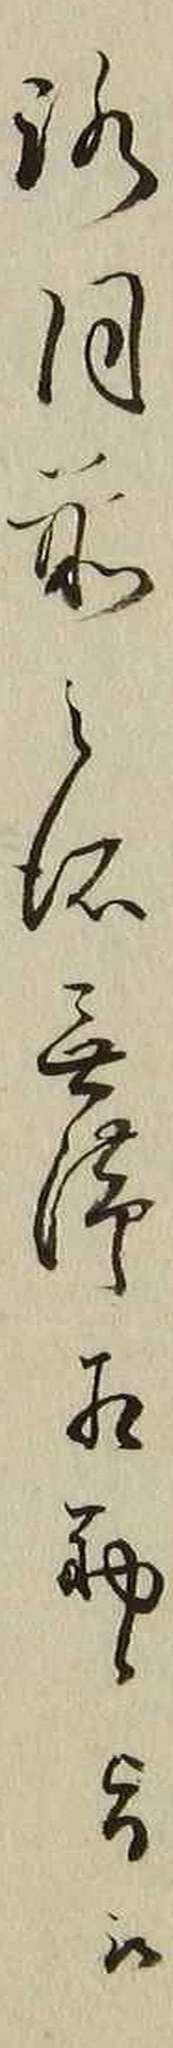路同前之所無滞相勤候旨被
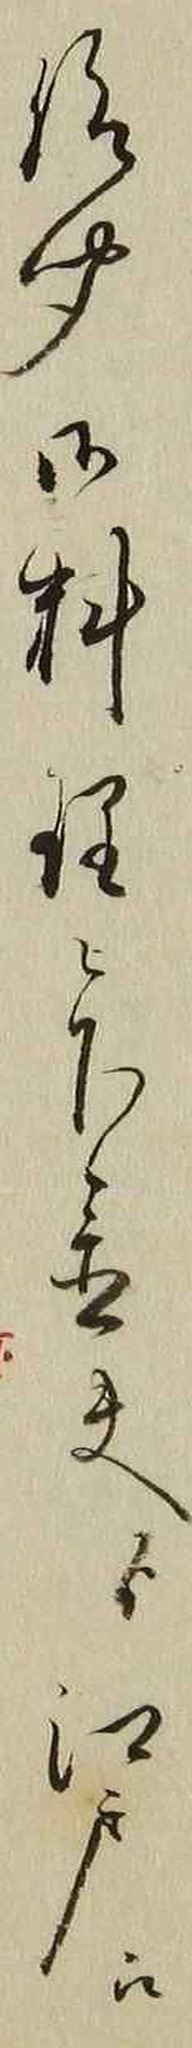仰聞御料理被下置夫ゟ江戸江
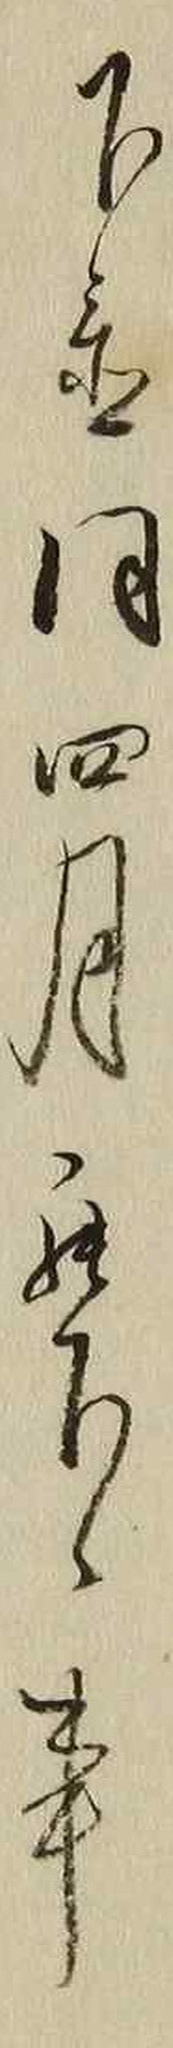下置同四月罷下候事
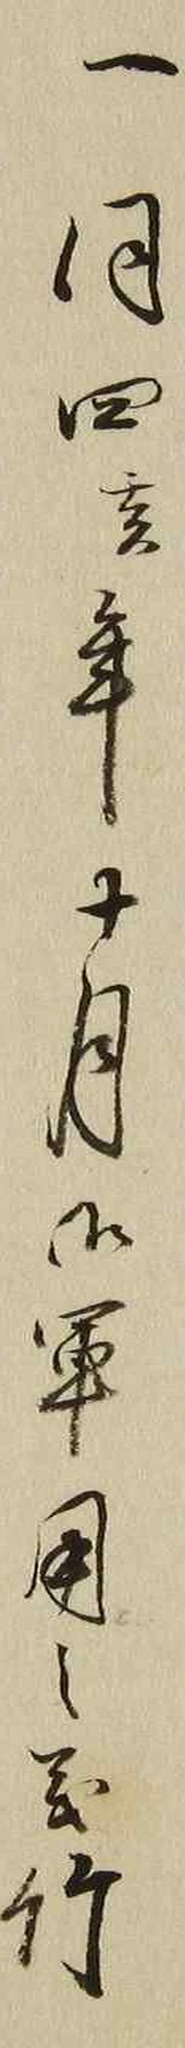一同四亥年十月御軍用之義竹
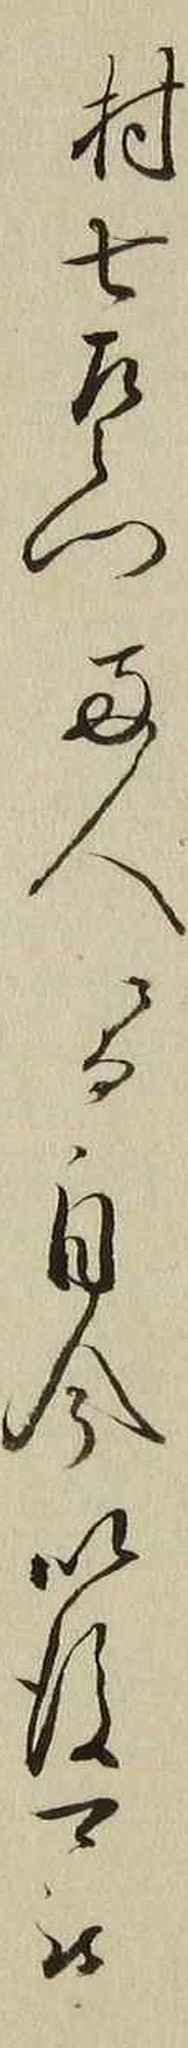村七左衛門両人ニ而自今以後可被
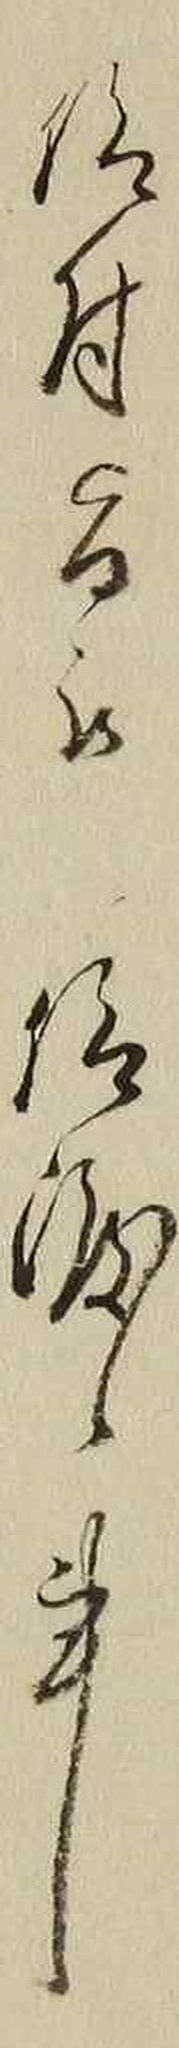仰付旨被仰渡候事
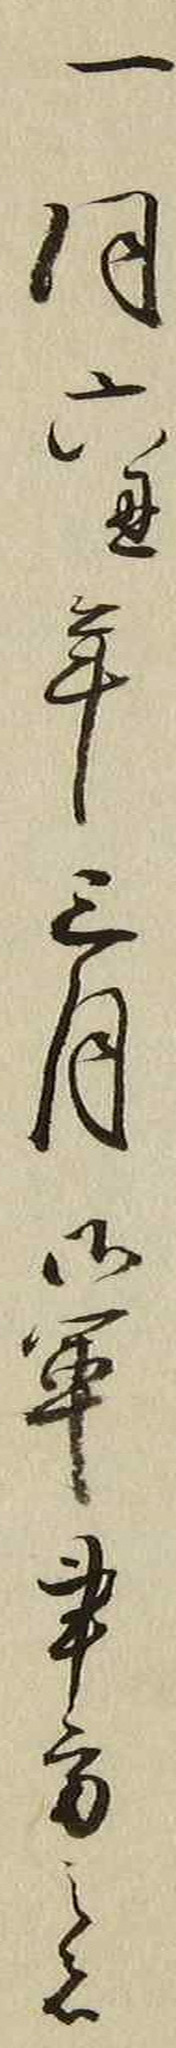一同六丑年三月御軍事方之者
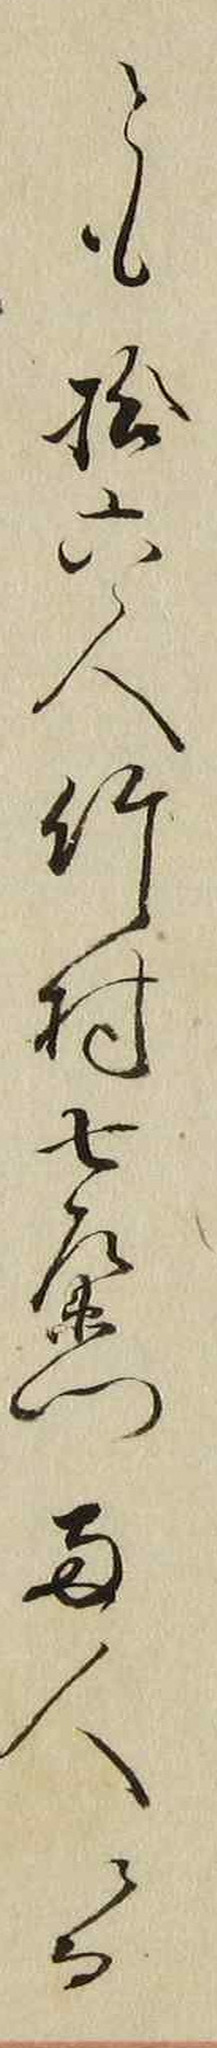とも拾六人竹村七左衛門両人ニ而
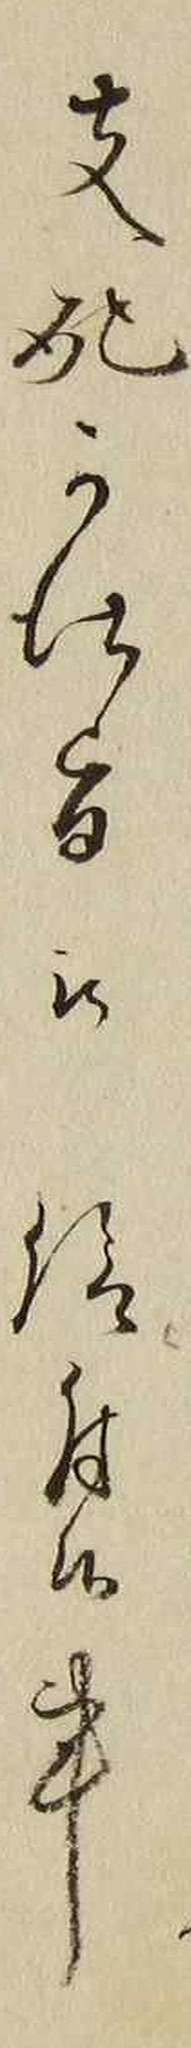支配可仕旨被仰付候事
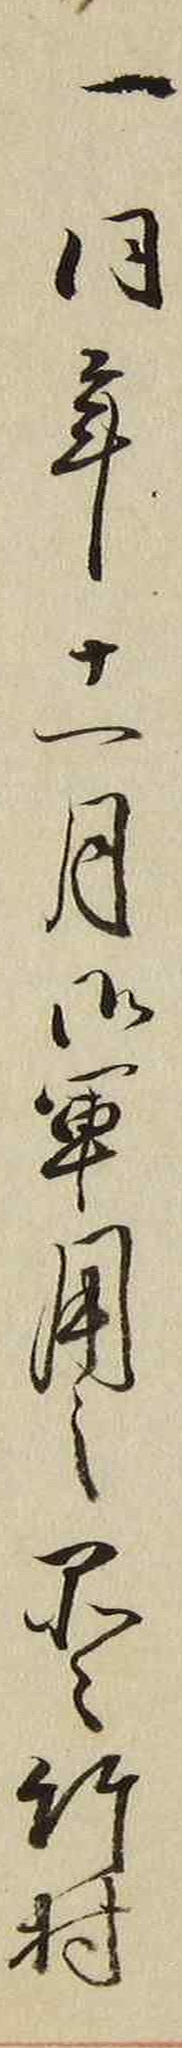一同年十一月御軍用之品々竹村
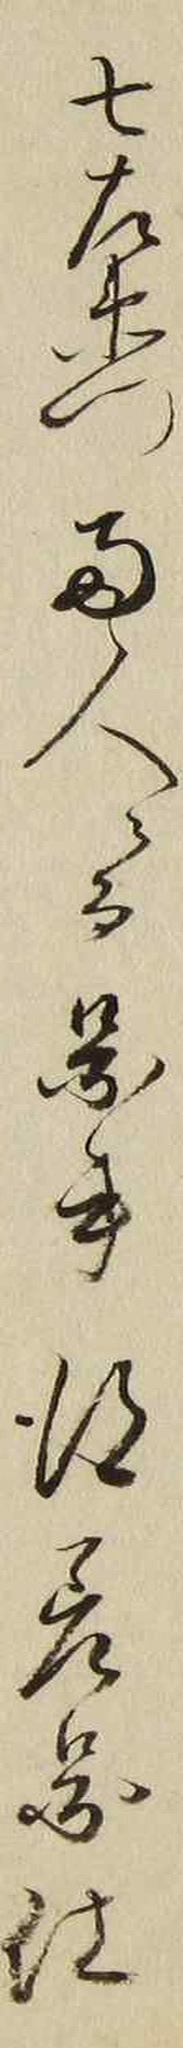七左衛門両人ニ而図書得差図仕
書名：諸士系譜　巻之1　い之部1
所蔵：会津若松市立会津図書館
